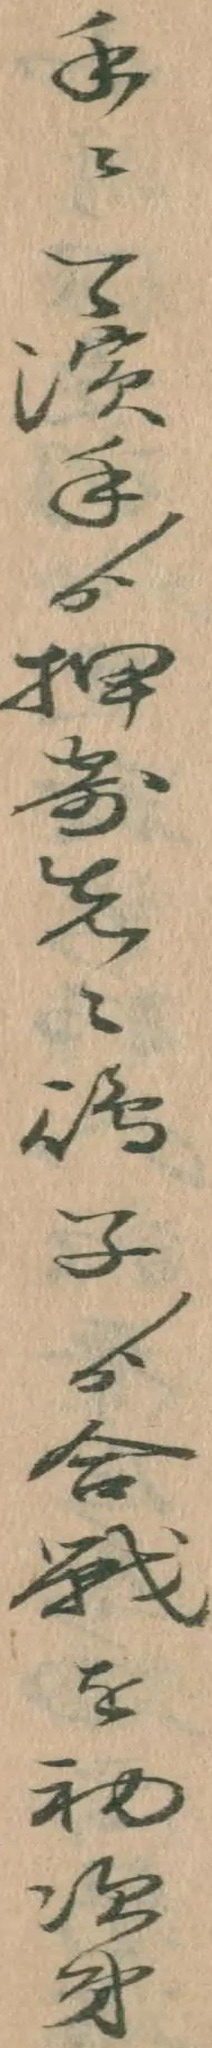手にて浜手ゟ押寄先に島子ゟ合戦を初次第
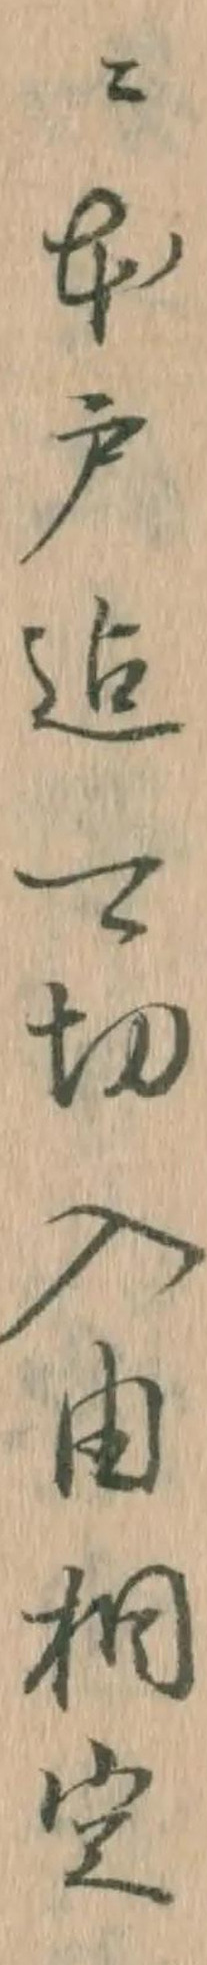に本戸迄可切入由相定
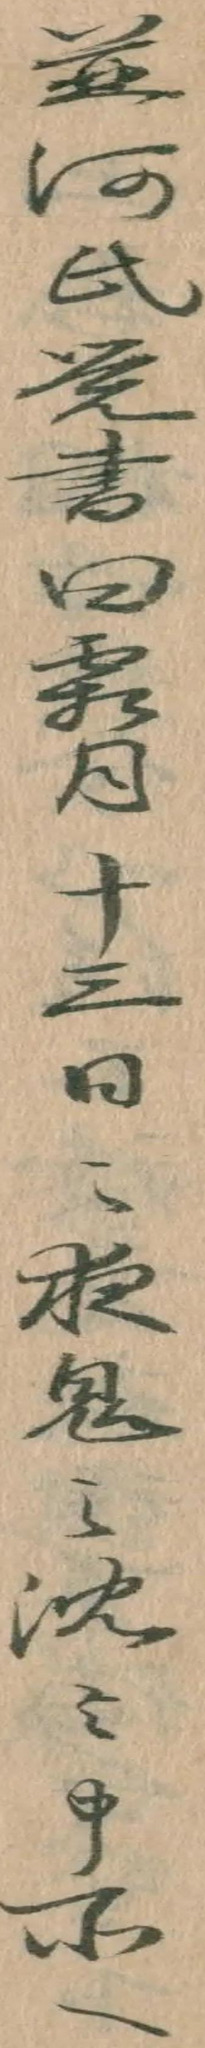並河氏覚書曰霜月十三日之夜鬼之沈与申所へ
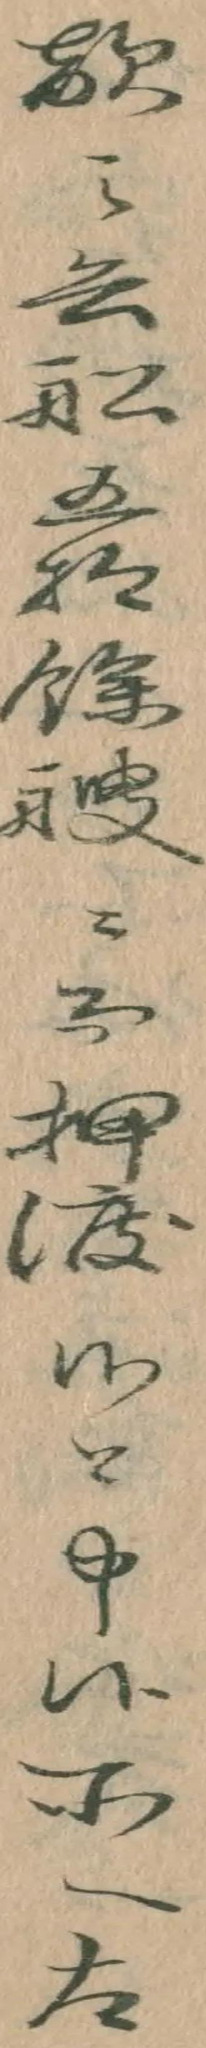敵の兵舩五拾余艘に而押渡候と申候所へ太
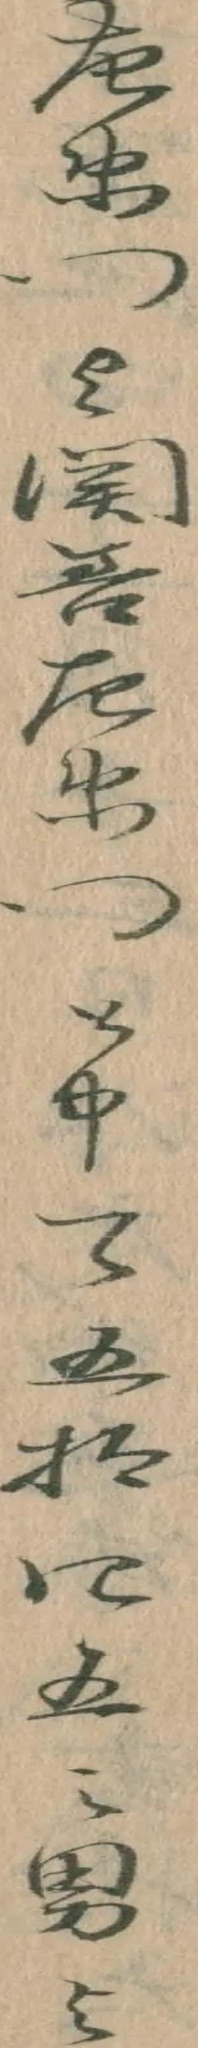左衛門与関善左衛門と申て五拾四五之男与
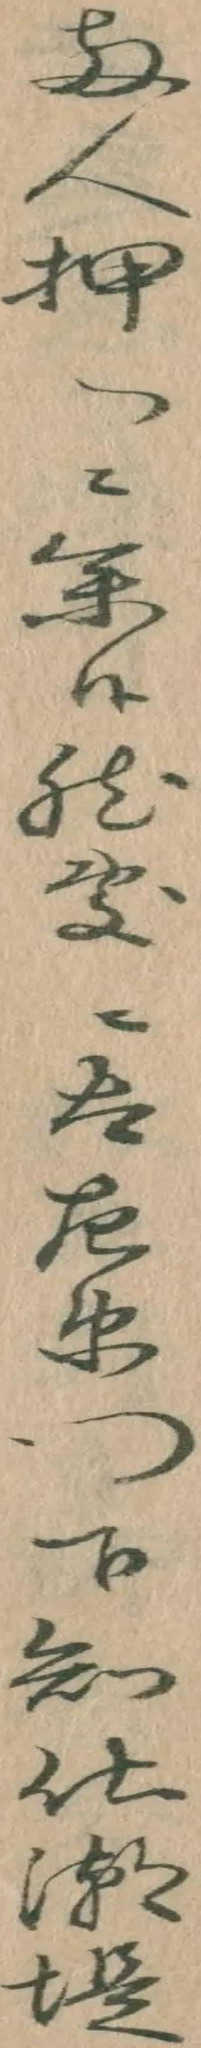両人押へに参候然処に太左衛門下知仕潮堤
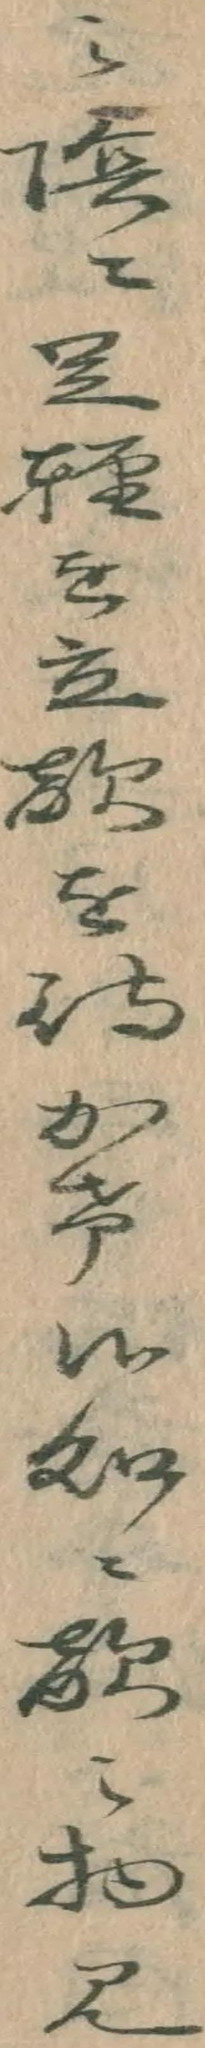之陰に足軽を立敵を待か希候処に敵之物見
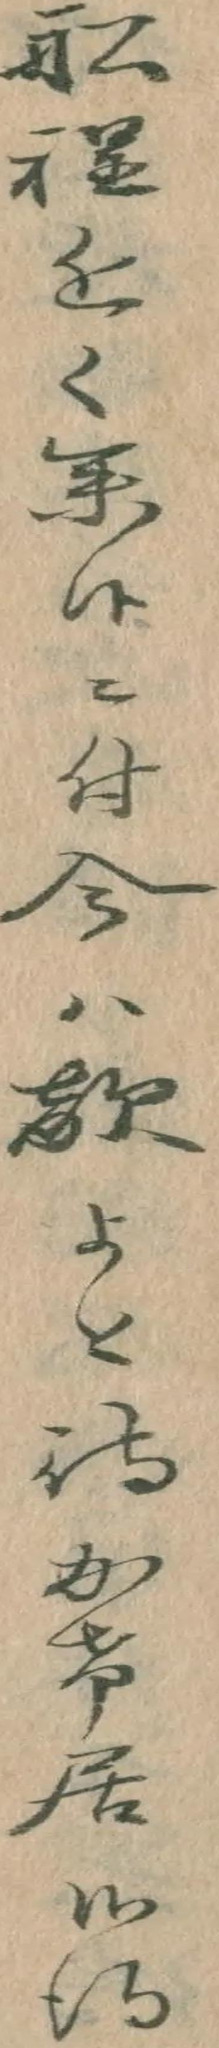舩程近く参候に付今は敵よと待か希居候得
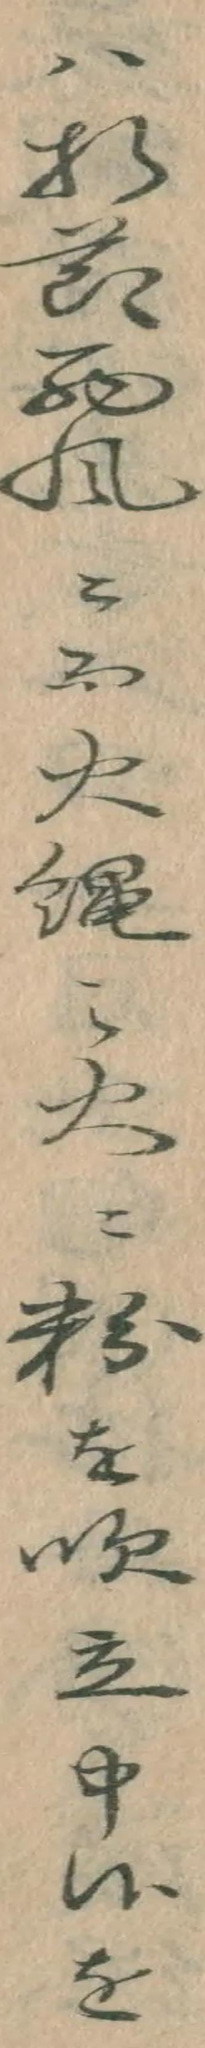は折節西風に而火縄之火に粉を吹立申候を
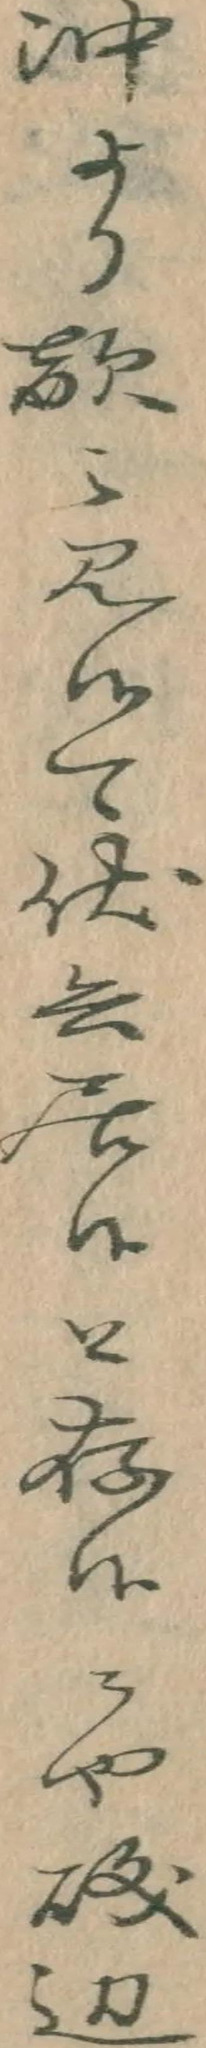沖より敵之見候て伏兵居候と存候にや磯辺
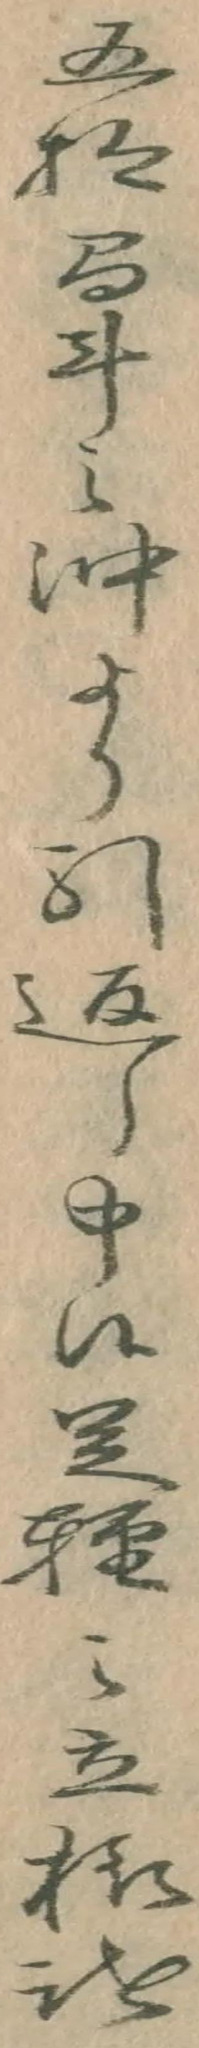五拾間斗之沖より引返し申候足軽之立様諸

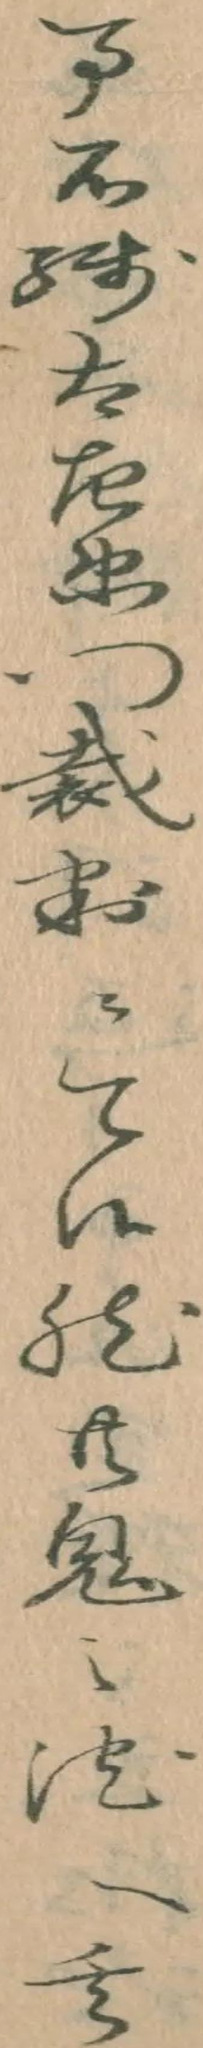事不残太左衛門裁判にて候然共鬼之沈へ其
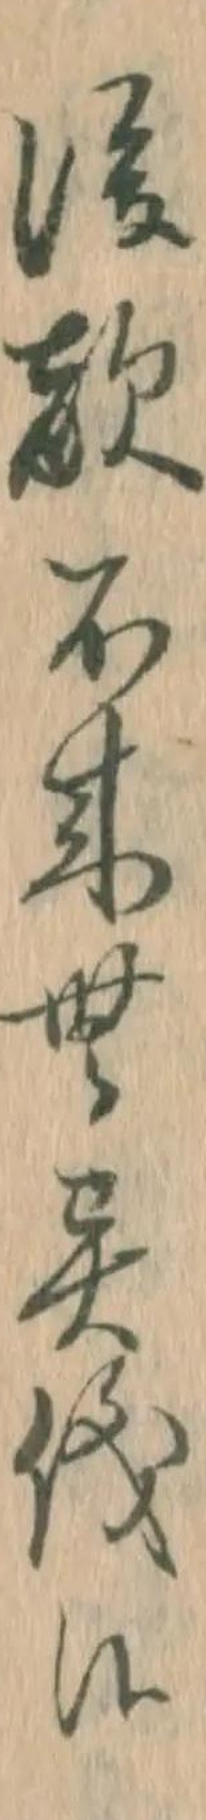後敵不来無異儀候
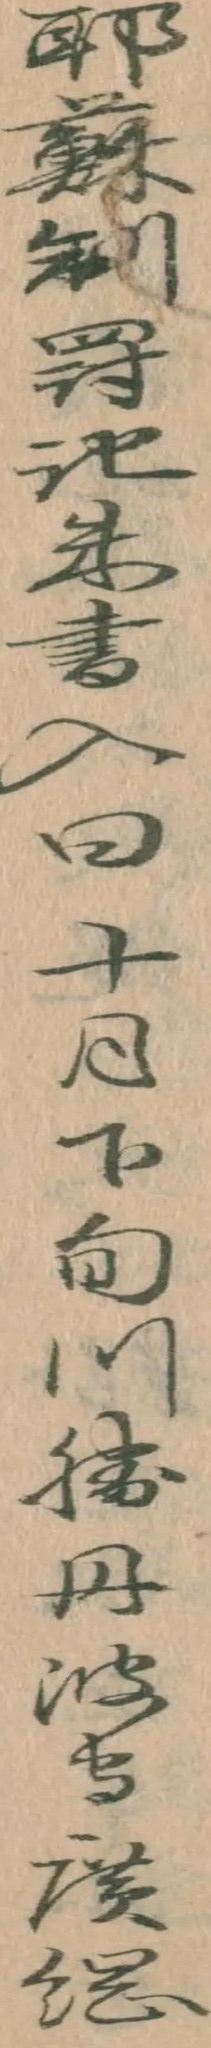耶蘇制罰記朱書入曰十月下旬川勝丹波守広綱
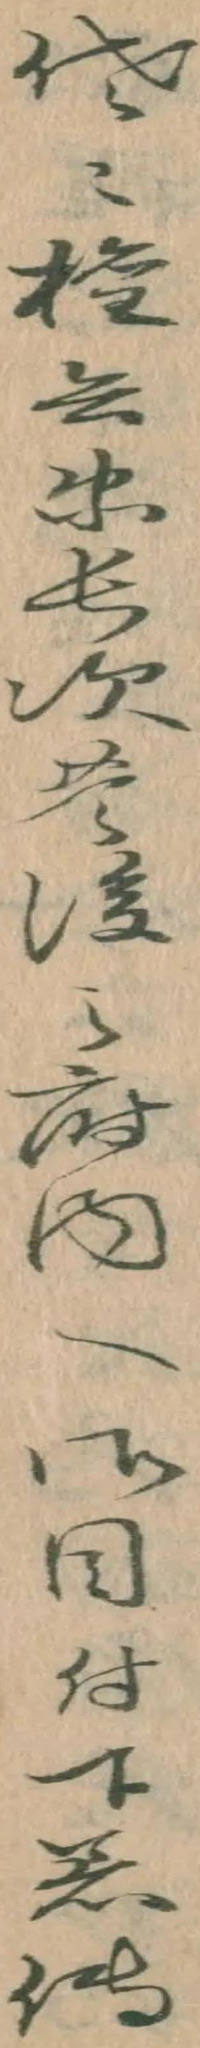佐々権兵衛長次豊後之府内へ御目付下着伝
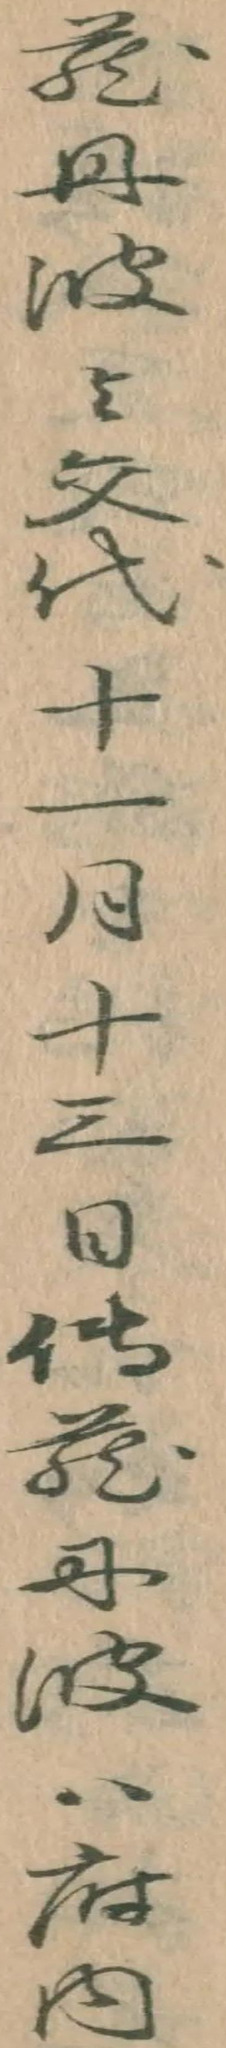蔵丹波与交代十一月十三日伝蔵丹波は府内
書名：切支丹御退治記 49巻. [2]
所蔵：国立国会図書館 National Diet Library, JAPAN
